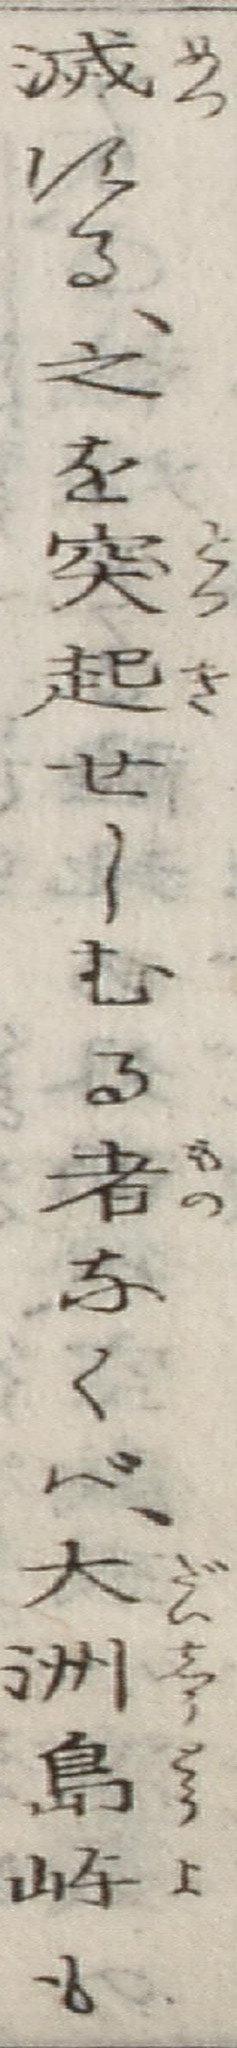滅する、之を突起せしむる者なくば、大洲島嶼も
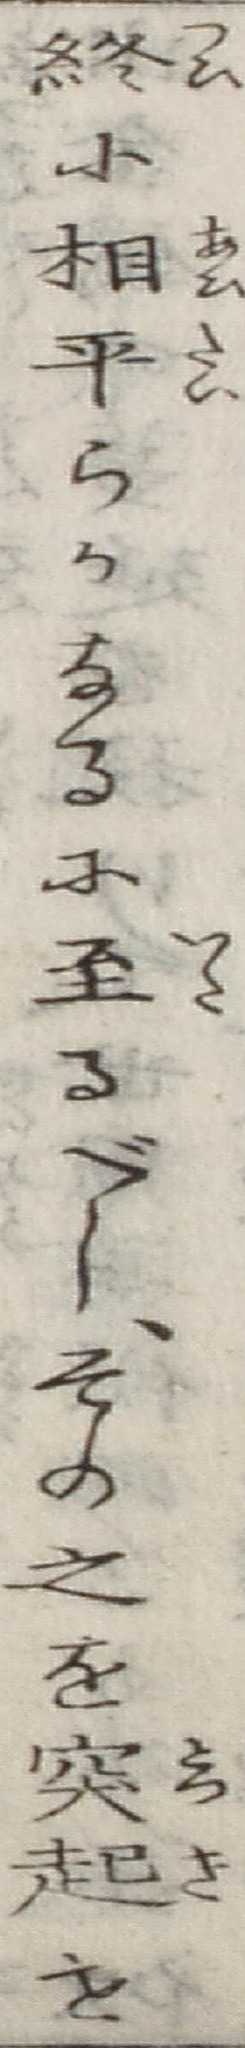終に相平らかなるに至るべし、その之を突起せ
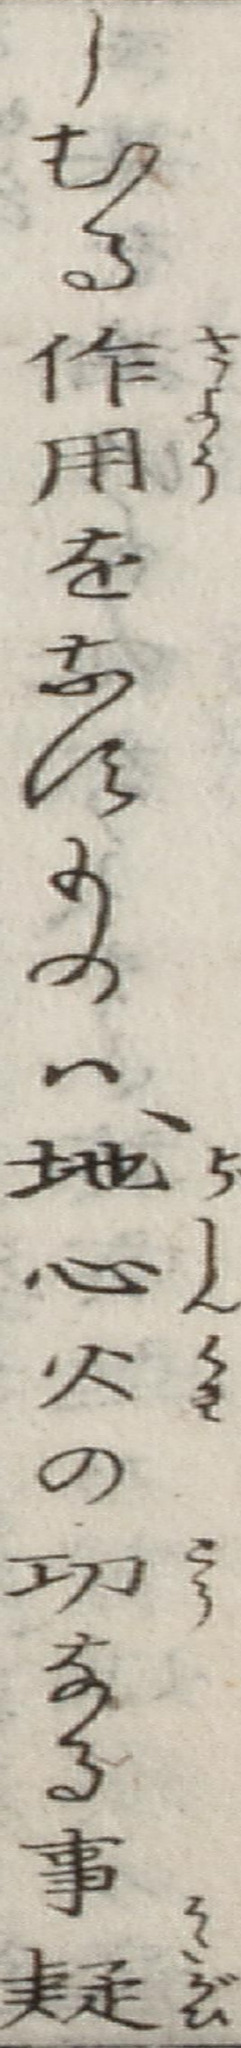しむる作用をなすものは、地心火の功なる事疑
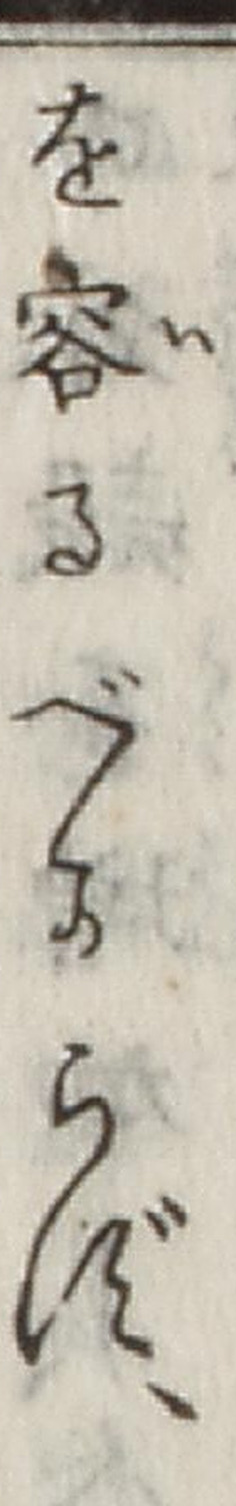を容るべからず、
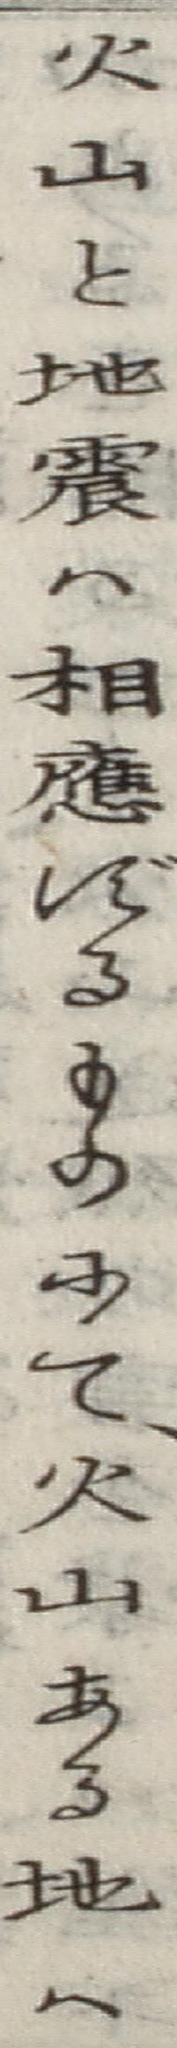火山と地震は相応ずるものにて、火山ある地は
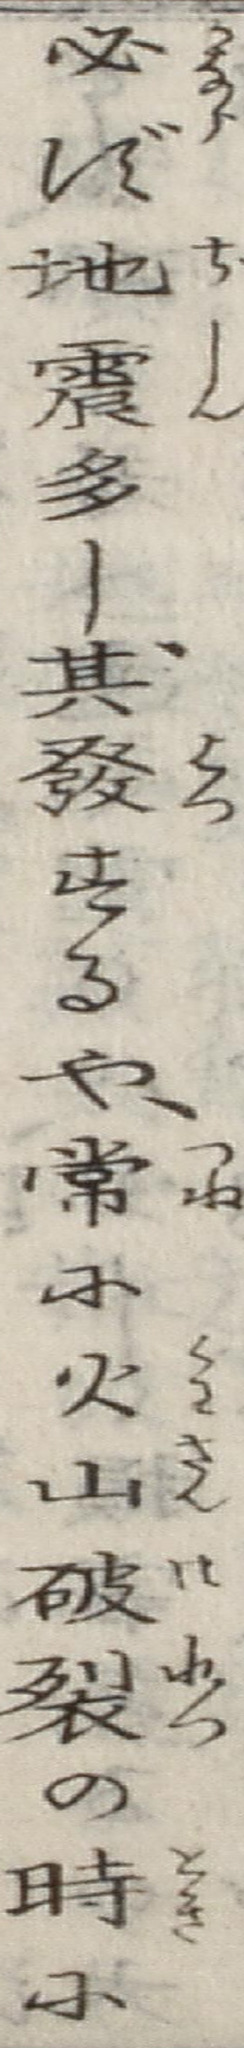必ず地震多し、其発するや、常に火山破裂の時に
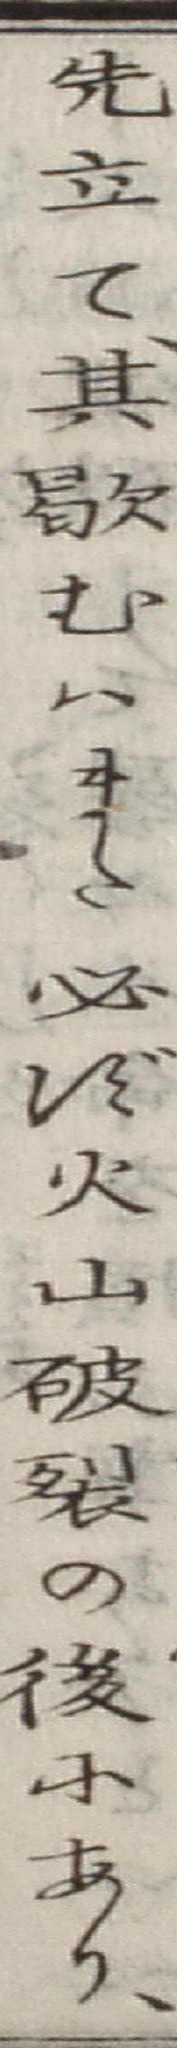先立て、其歇むはまた必ず火山破裂の後にあり、
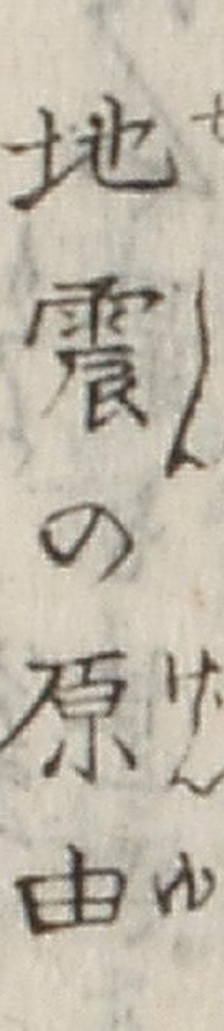地震の原由
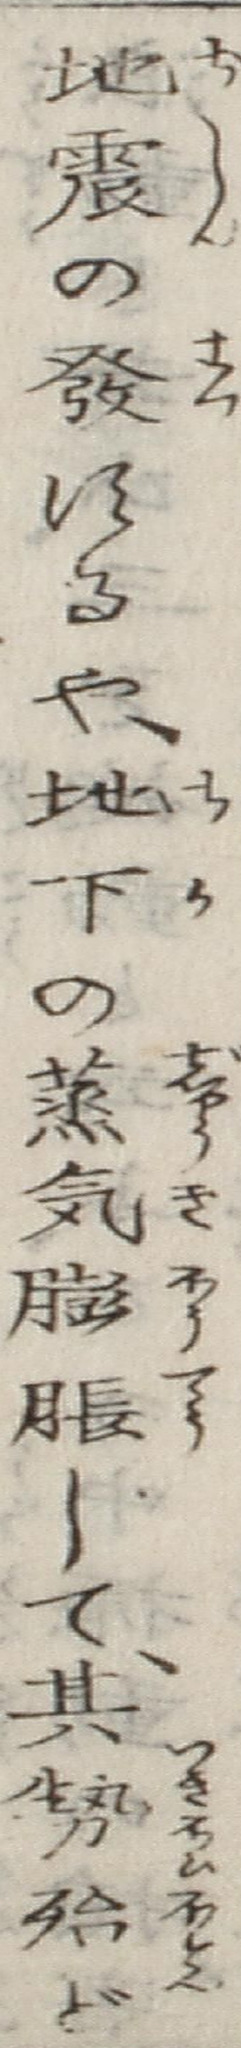地震の発するや、地下の蒸気膨張して、その勢殆ど
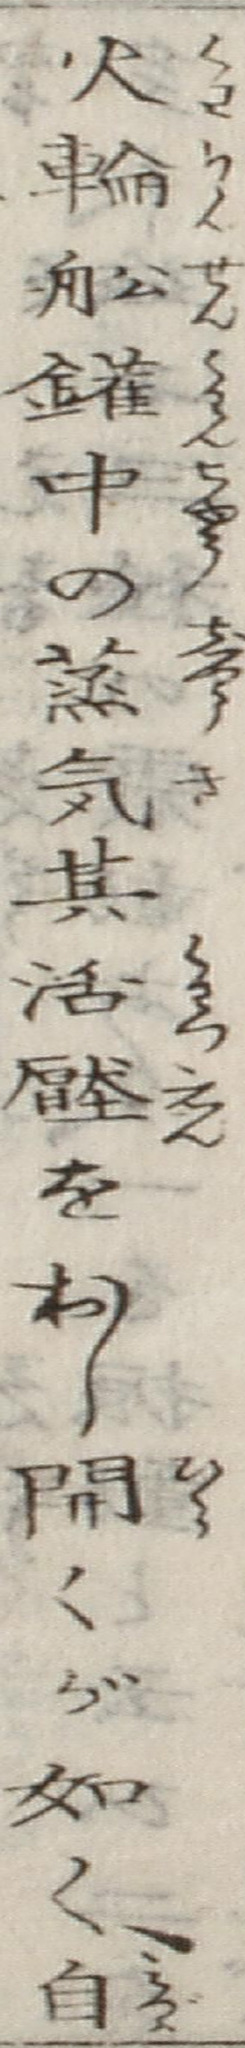火輪船鑵中の蒸気其の活圧をおし開くが如く、自
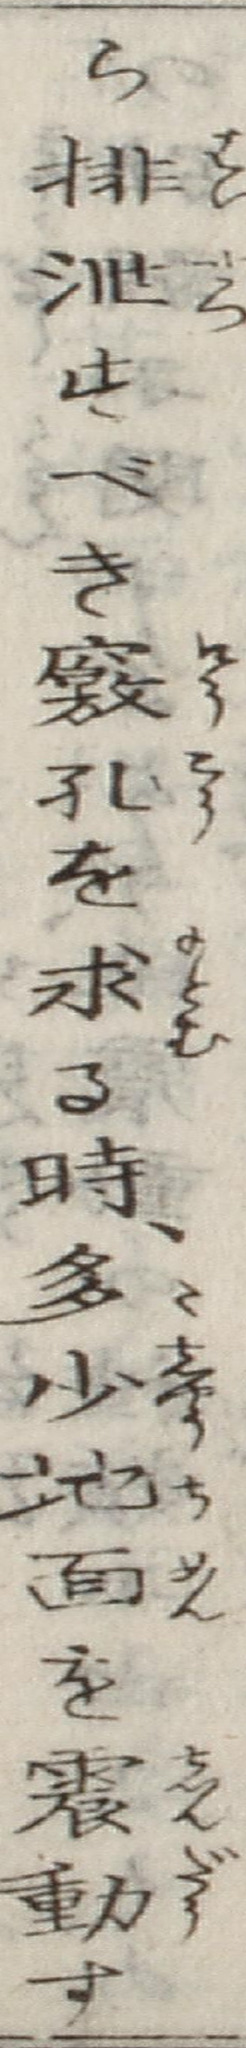ら排泄すべき竅孔を求る時、多少地面を震動す
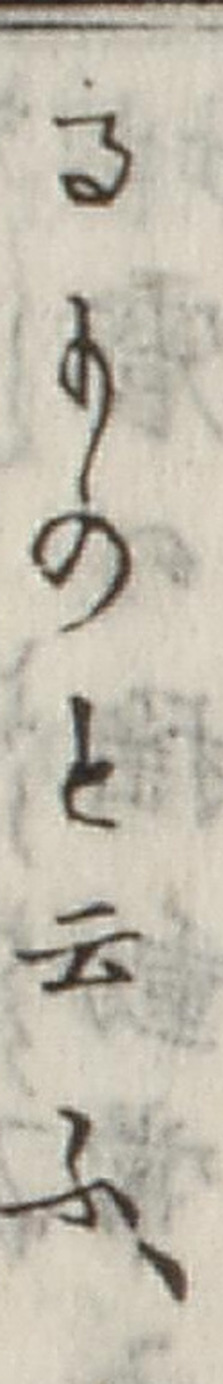るものと云ふ、
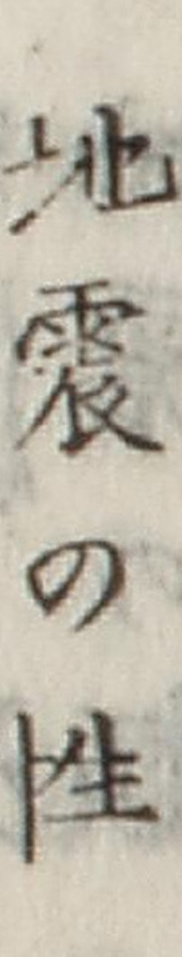地震の性
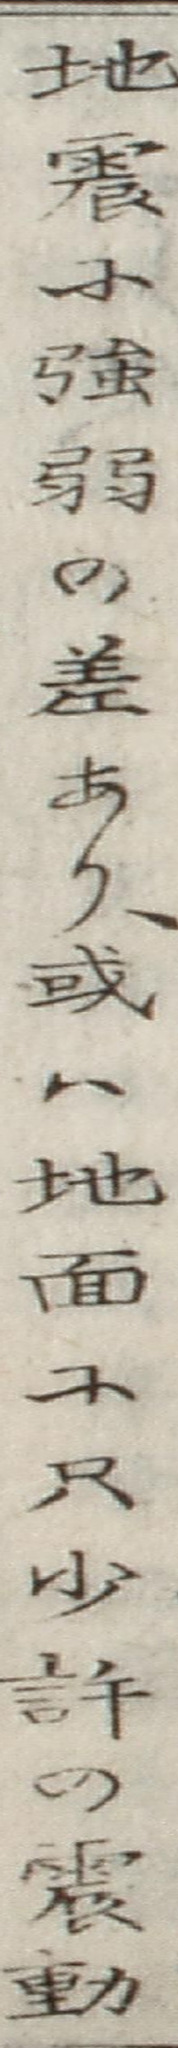地震に強弱の差あり、或は地面に只少許の震動
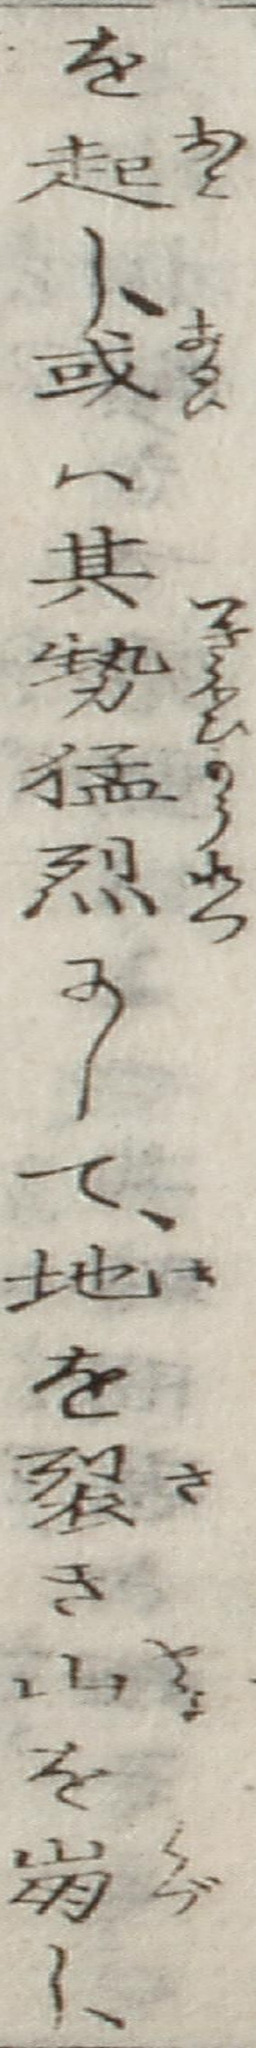を起し、或は其勢猛烈にして、地を裂き山を崩し、
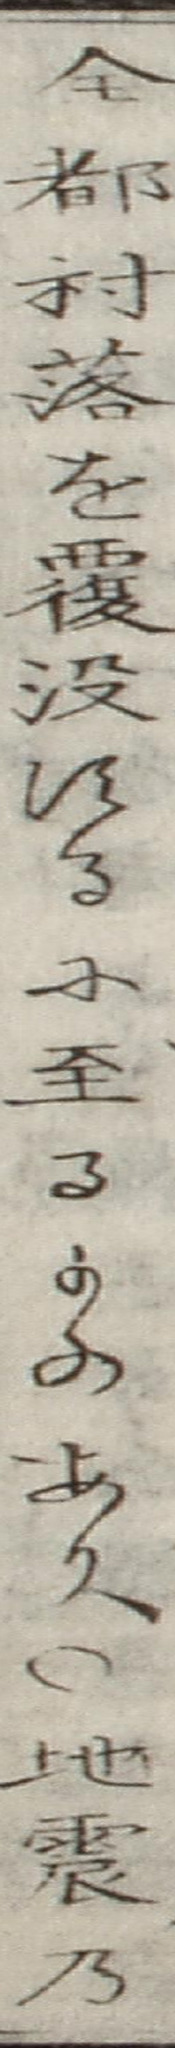全都村落を覆没するに至るものあり、〇地震の
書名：訓蒙　天然地理學　上
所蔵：東京大学地震研究所図書室 Earthquake Research Institute Library, The University of Tokyo, JAPAN
